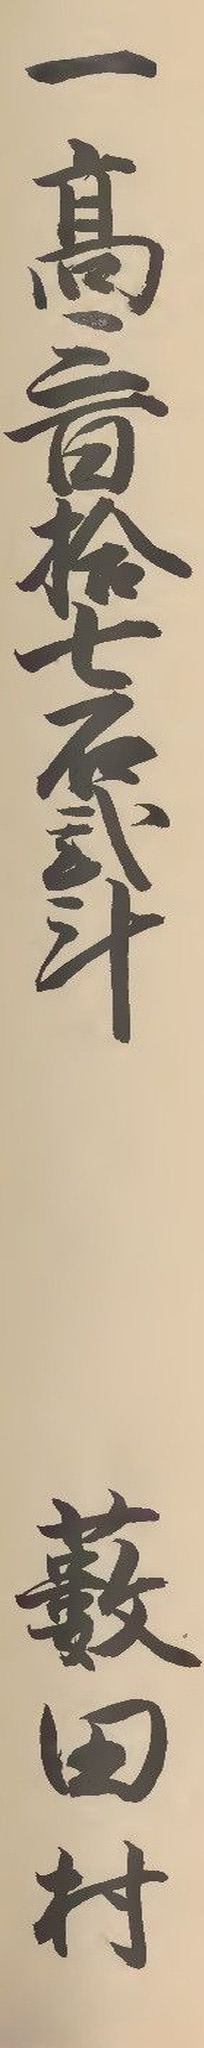一髙三百拾七石弐斗藪田村
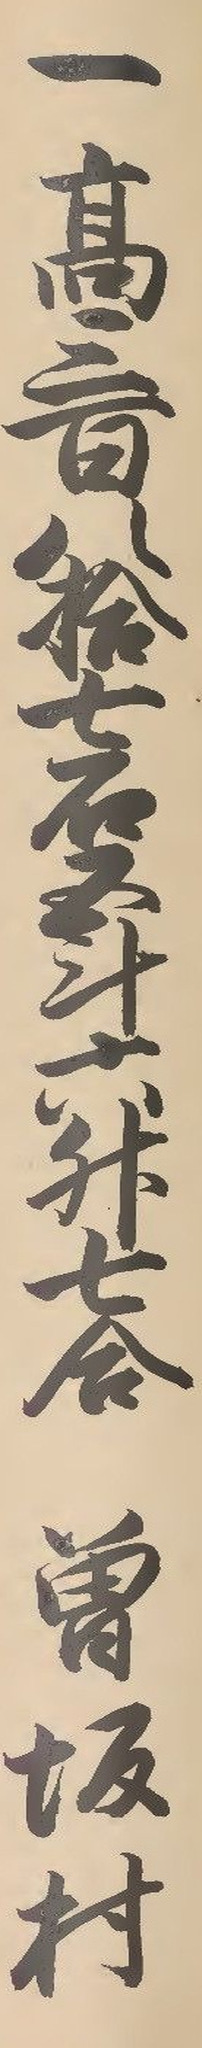一髙三百八拾七石五斗六升七合曽坂村
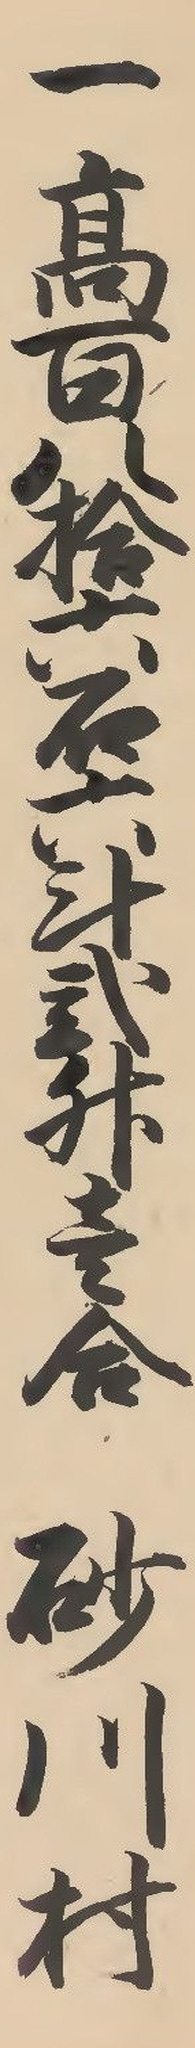一髙百八拾六石六斗弐升壱合砂川村
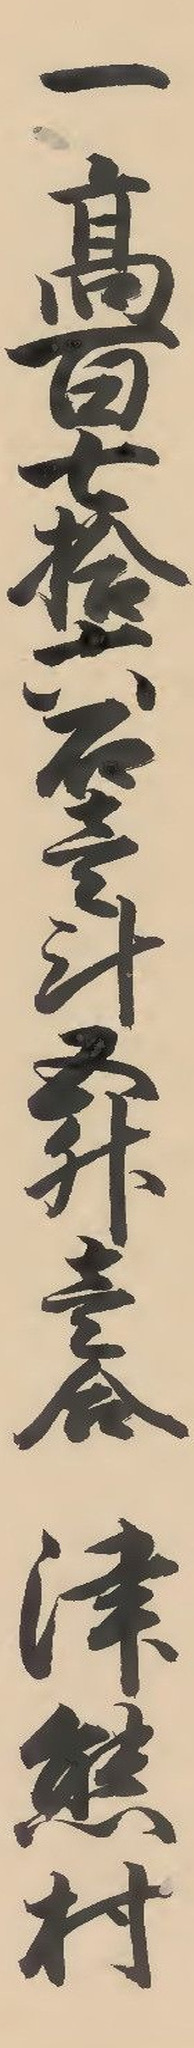一髙百七拾六石壱斗五升壱合津熊村
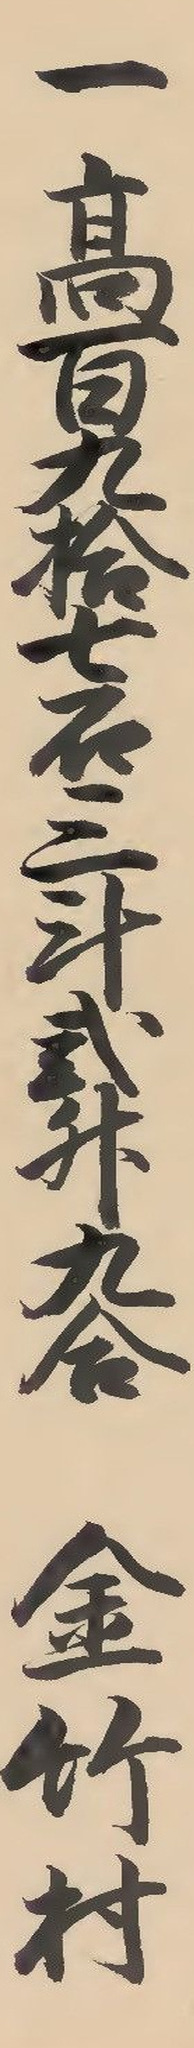一髙百九拾七石弐斗弐升九合金竹村

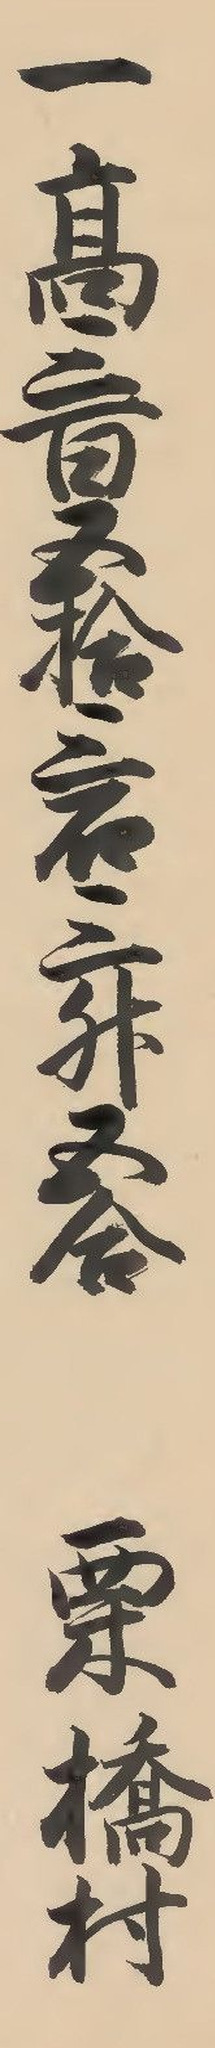一髙三百五拾三石三升五合栗橋村
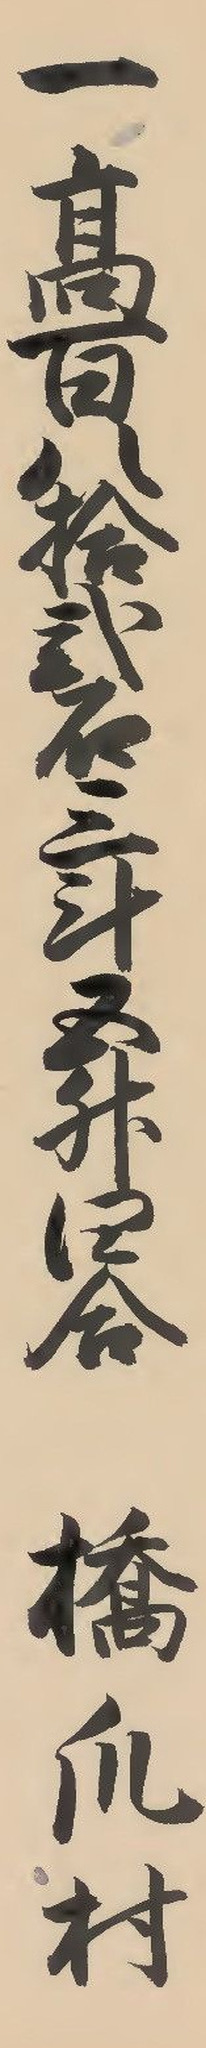一髙百八拾弐石三斗五升四合橋爪村
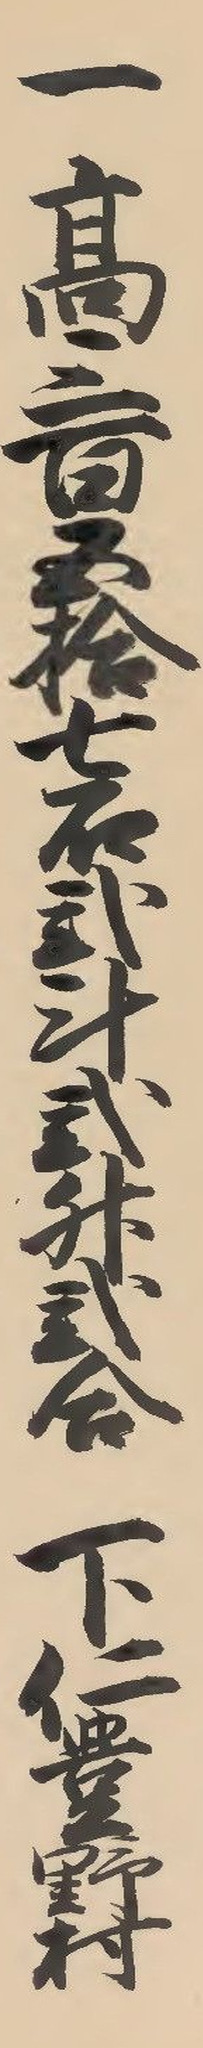一髙三百五拾七石弐斗弐升弐合下仁豊野村
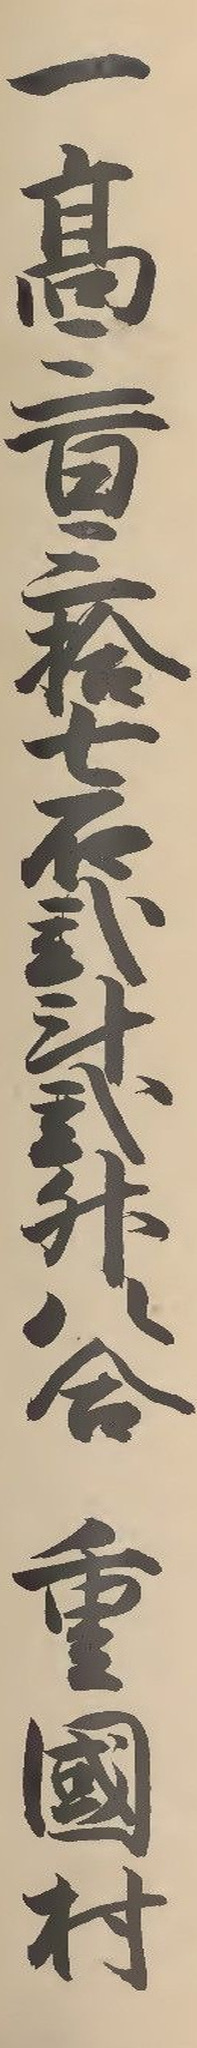一髙三百三拾七石弐斗弐升八合重國村
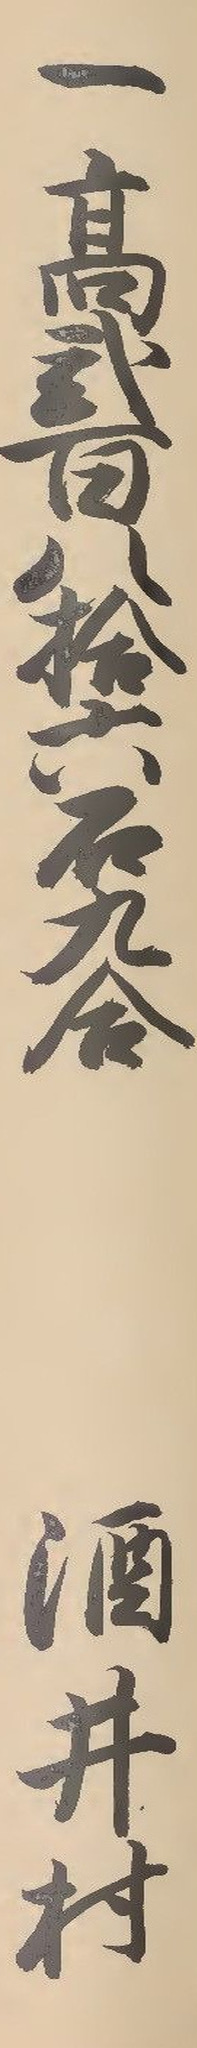一髙弐百八拾六石九合酒井村
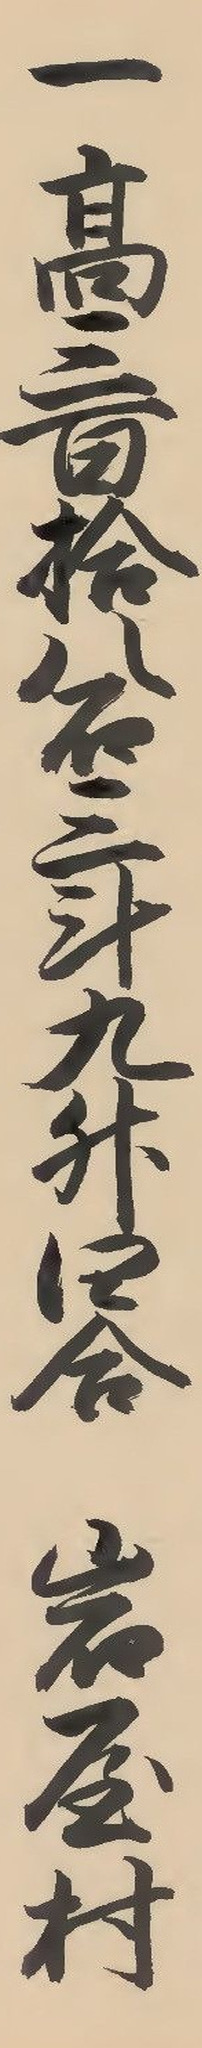一髙三百拾八石三斗九升四合岩屋村
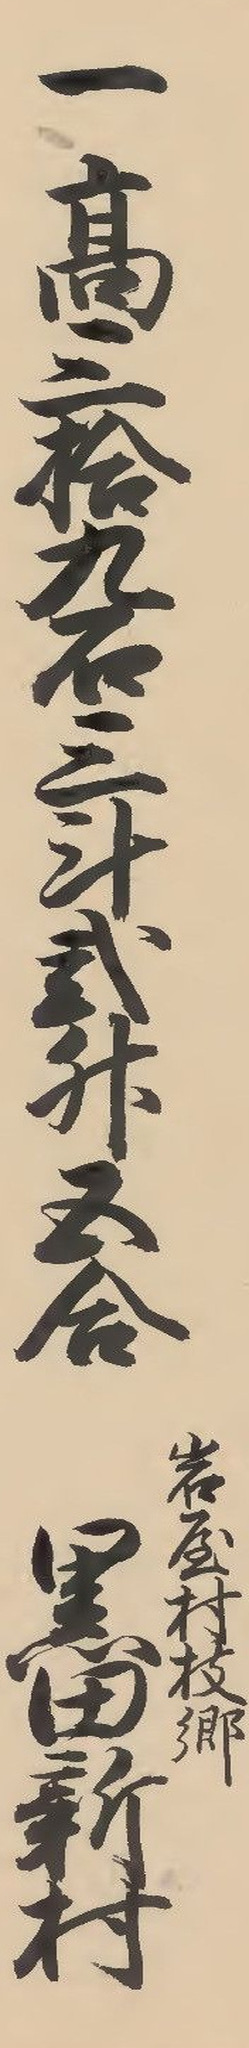一髙三拾九石三斗弐升五合黑田新村
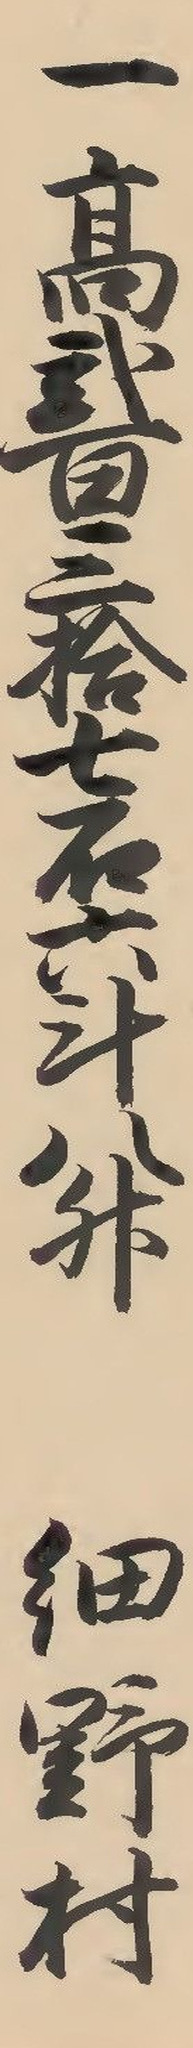一髙弐百三拾七石六斗八升細野村

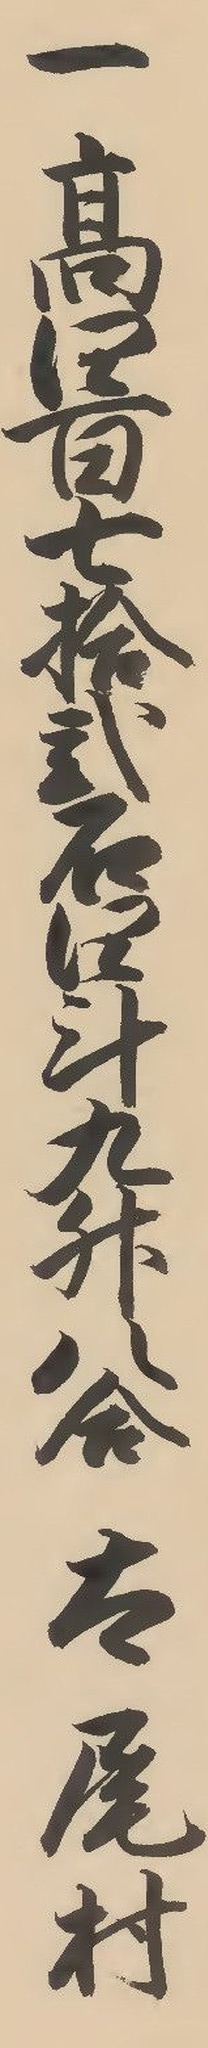一髙四百七拾弐石四斗九升八合太尾村
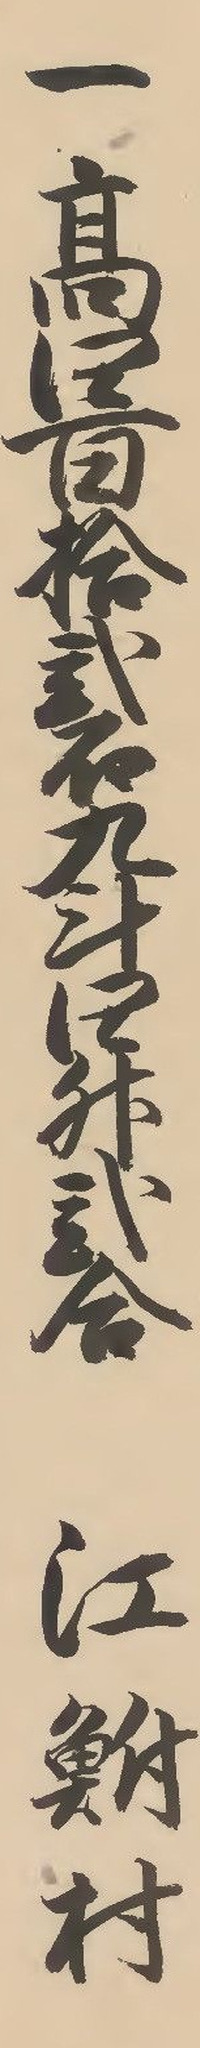一髙四百拾弐石九斗四升弐合江鮒村
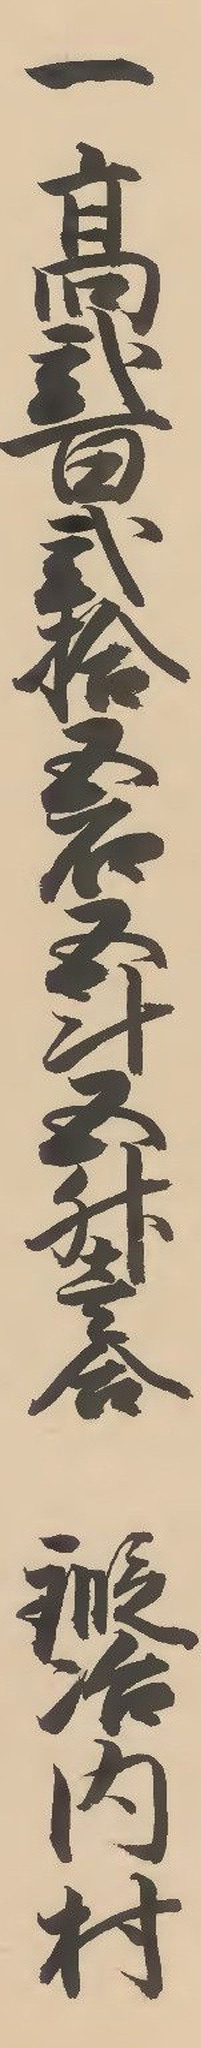一髙弐百弐拾五石五斗五升壱合鍛冶内村
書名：播磨国郷帳
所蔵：国立公文書館 National Archives of Japan
